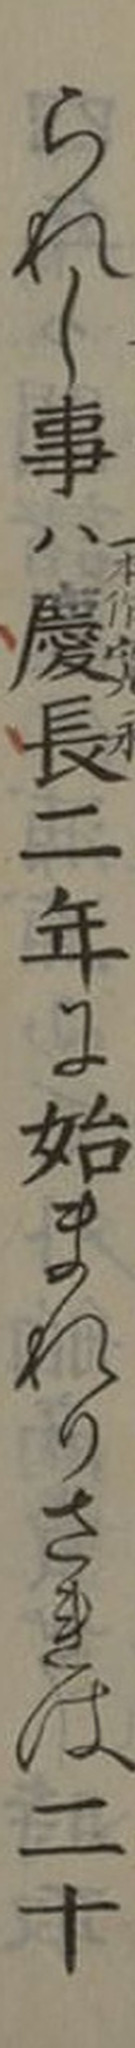られし事は慶長二年に始まれりされは二十

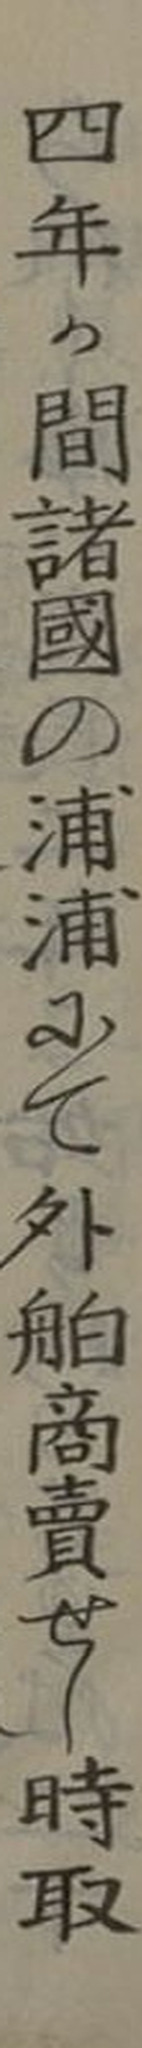四年の間諸國の浦浦にて外舶商賣せし時取
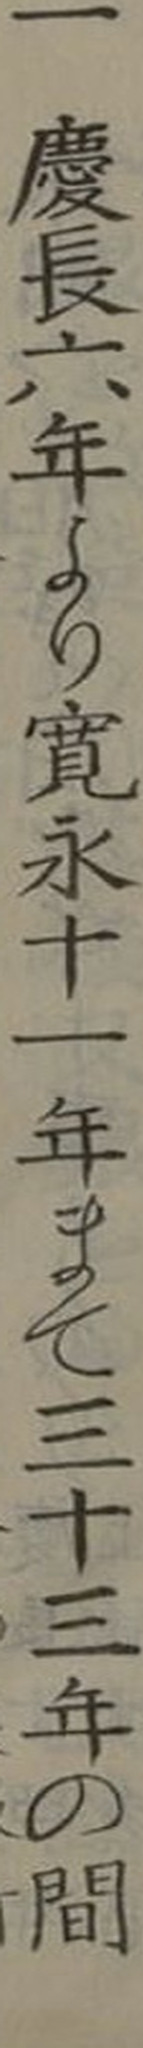一慶長六年より寛永十一年まて三十三年の間
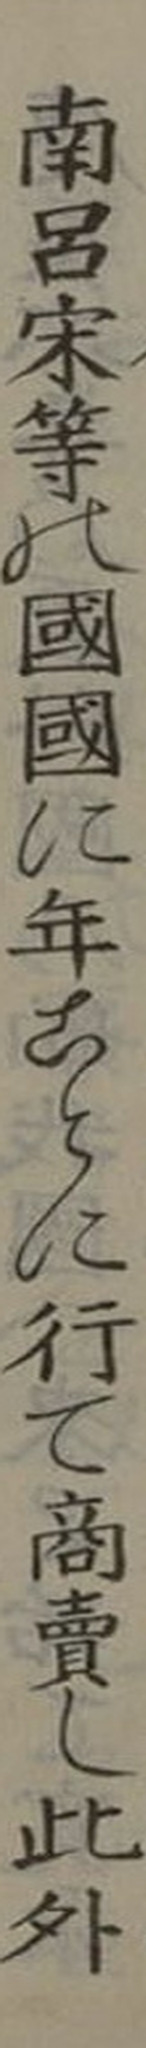南呂宋等の國國に年ことに行て商賣し此外
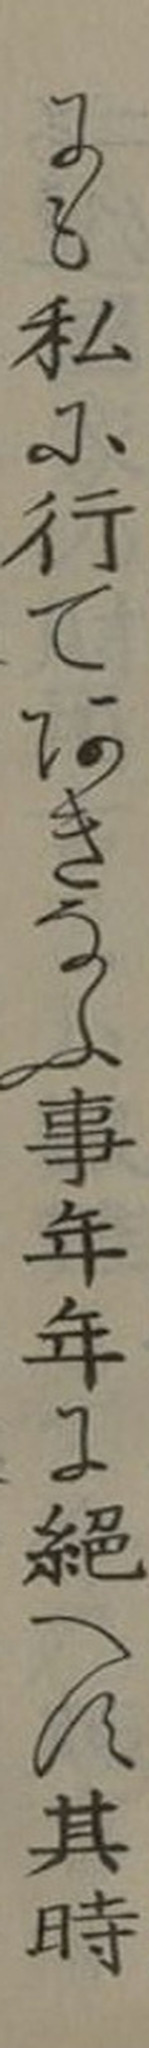にも私に行てあきなふ事年年に絕へす其時
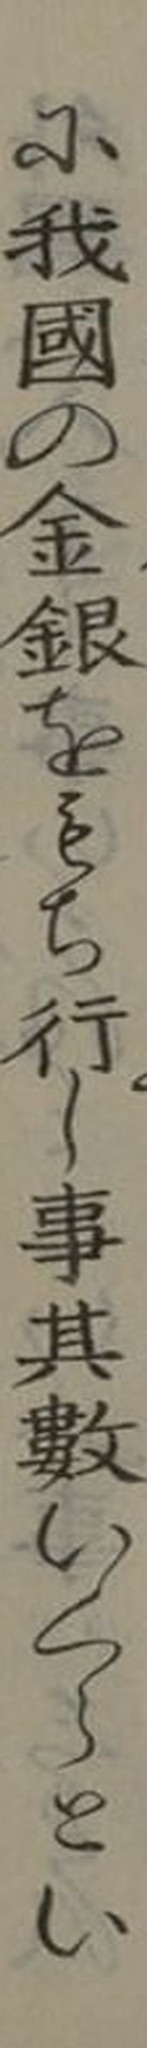に我國の金銀をもち行し事其數いくらとい
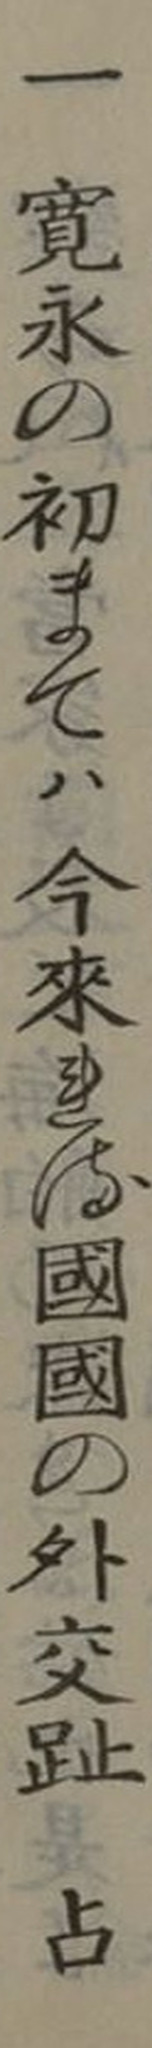一寛永の初まては今來れる國國の外交趾占
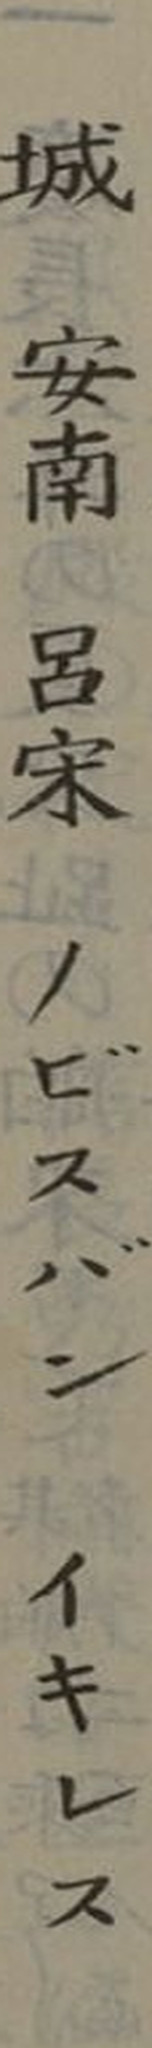城安南呂宋ノビスバンイキレス
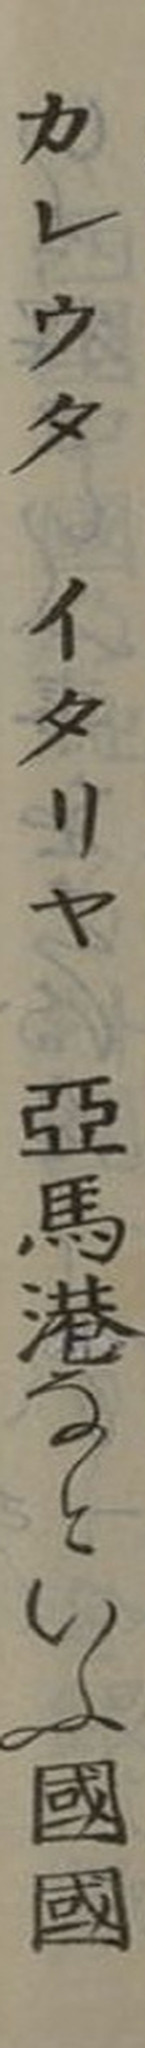カレウタイタリヤ亞馬港なといふ國國
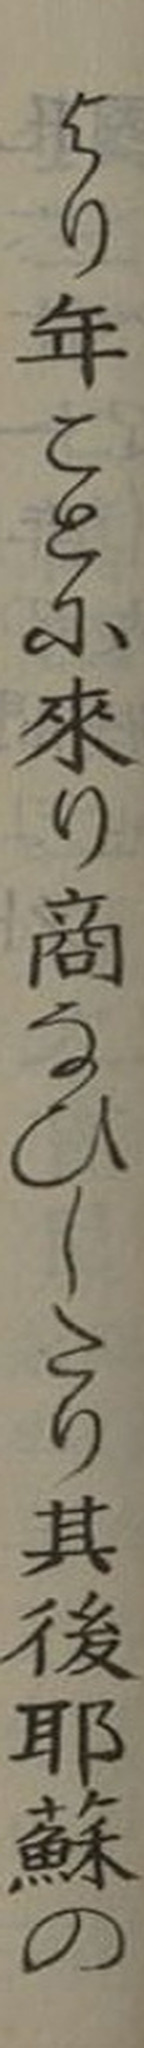より年ことに來り商なひしたり其後耶蘇の
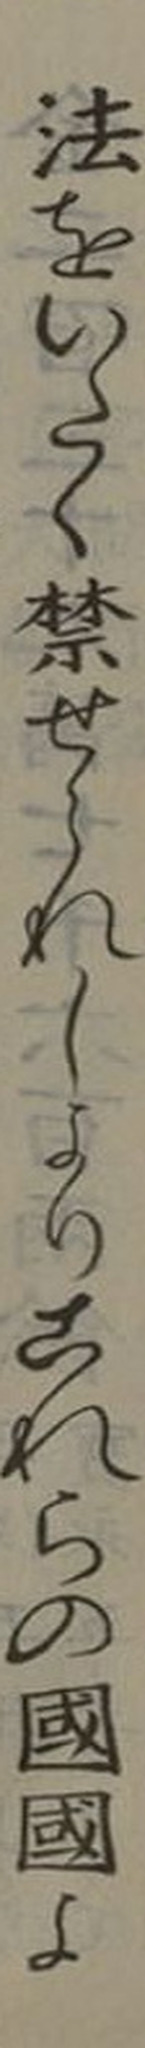法をいたく禁せられしよりこれらの國國よ
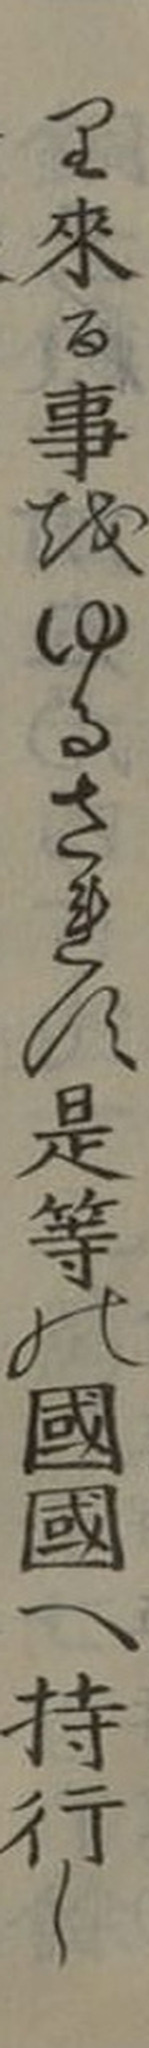り來る事をゆるされす是等の國國へ持行し
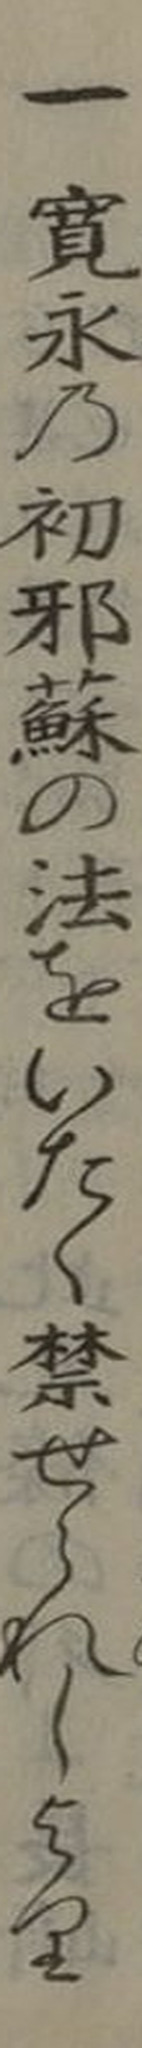一寛永の初邪蘇の法をいたく禁せられしより
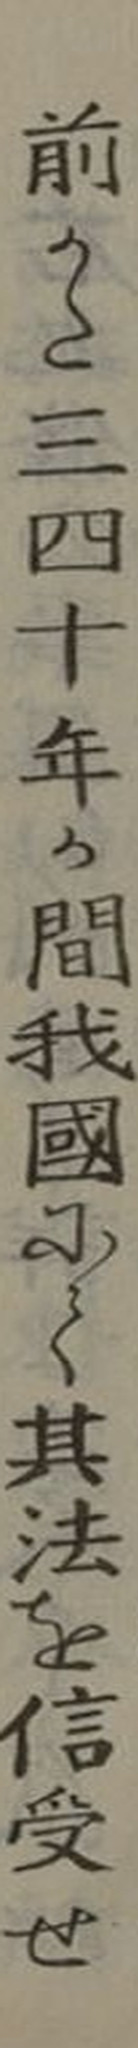前かた三四十年か間我國にて其法を信受せ
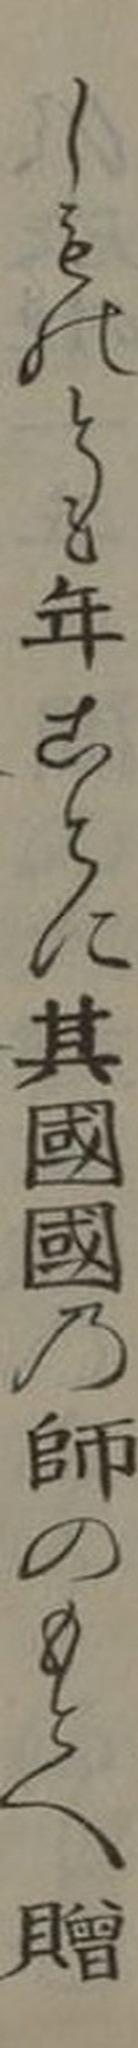しものとも年ことに其國國の師のもとへ贈
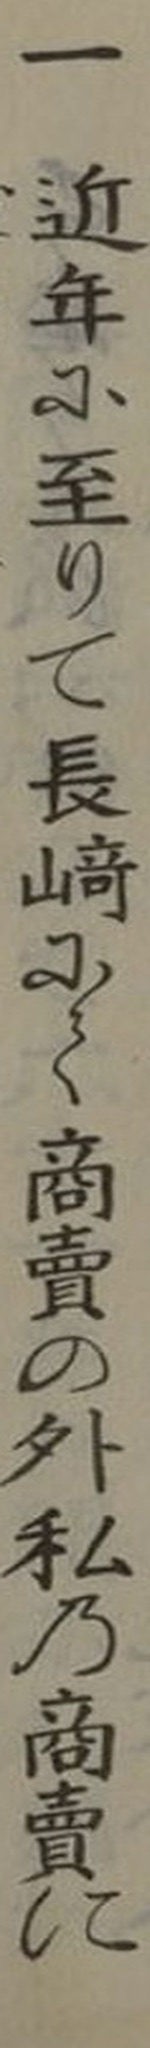一近年に至りて長﨑にて商賣の外私の商賣に
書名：骨董録
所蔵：University of the Ryukyus Library
